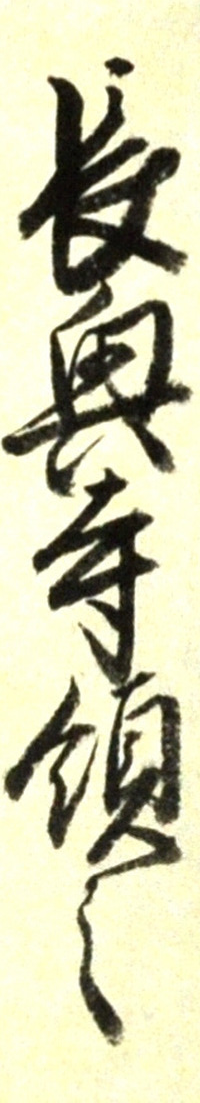長興寺領之
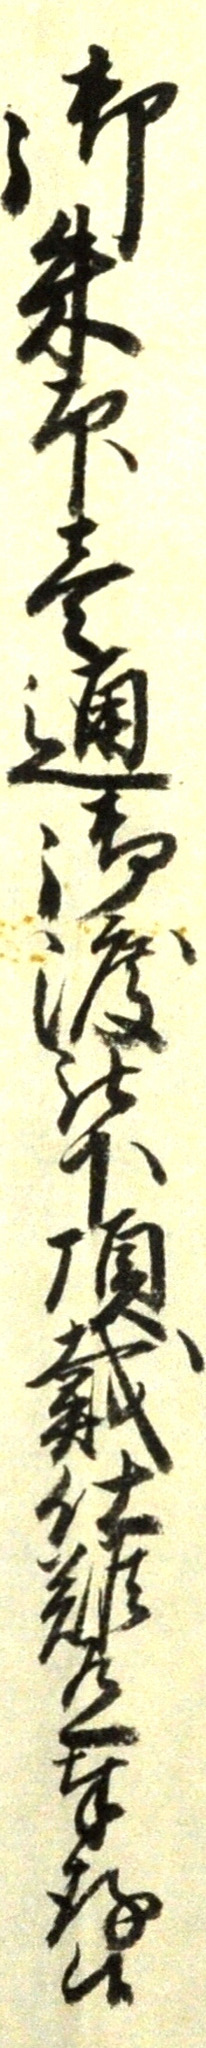御朱印壱通御渡被下頂戴仕難有奉存候
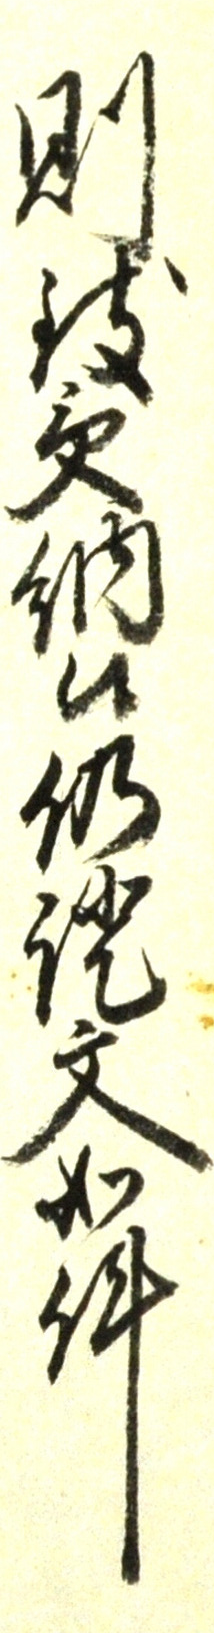則致受納候仍証文如件
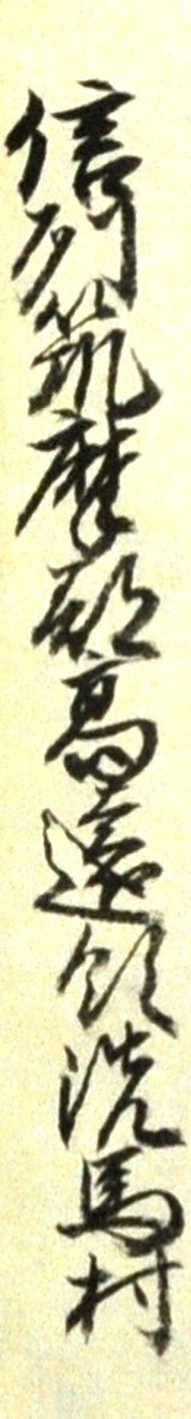信州筑摩郡高遠領洗馬村
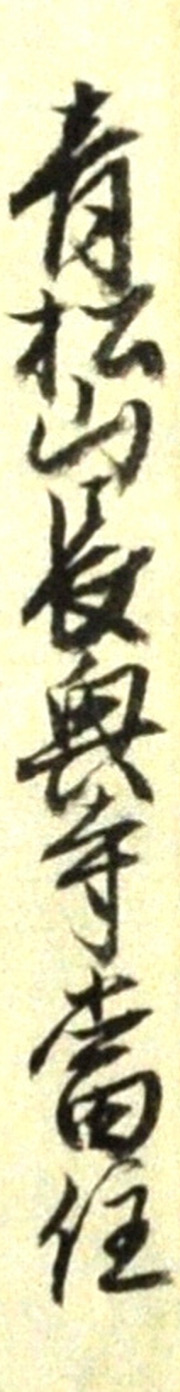青松山長興寺当住
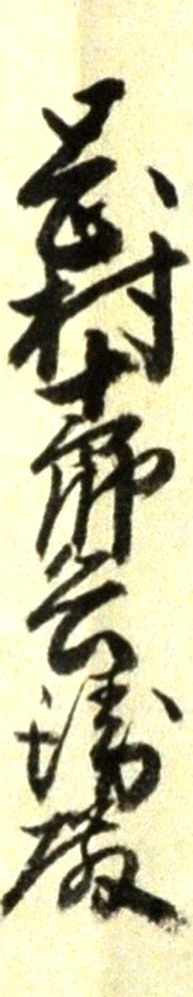岡村十郎兵衛殿
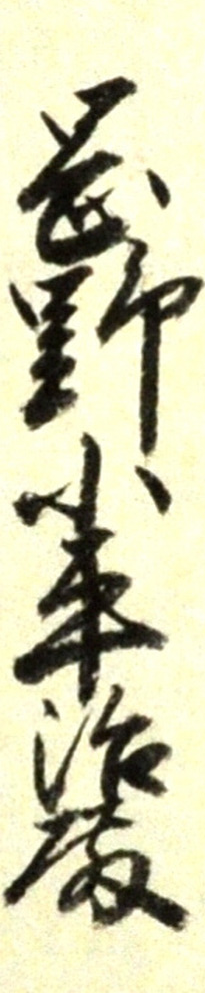岡野小平治殿
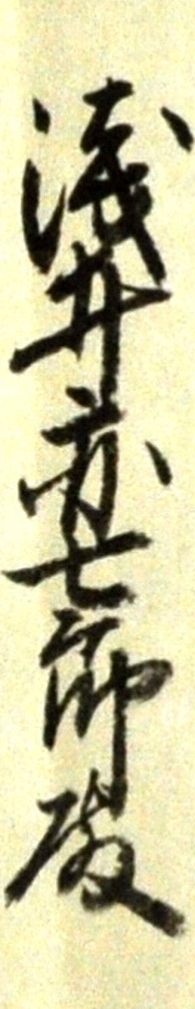浅井亦七郎殿
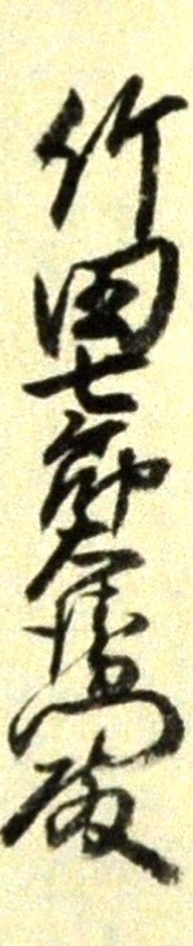竹田七郎右衛門殿
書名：証文
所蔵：伊那市立高遠町図書館・合同会社AMANE
